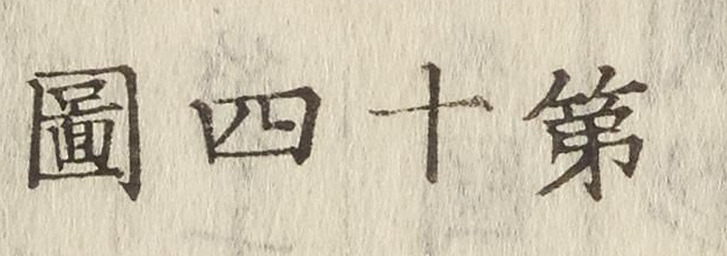第十四図
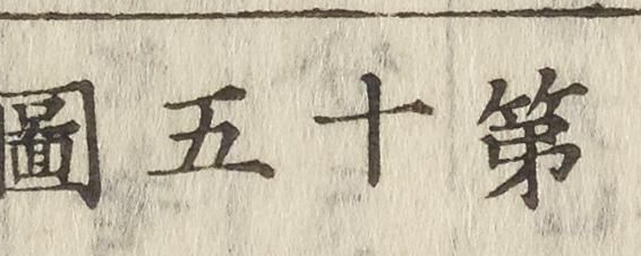第十五図

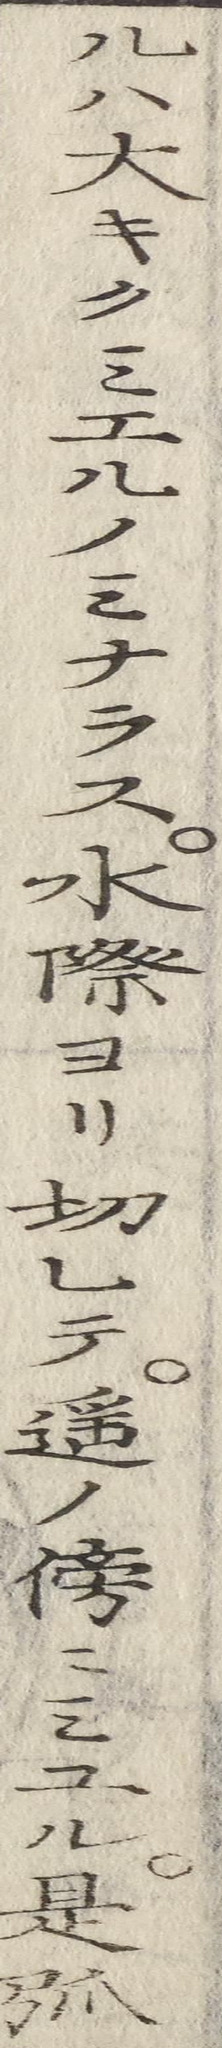ルハ大キクミエタルノミナラス。水際ヨリ切レテ。遙ノ傍ニミユル。是弧
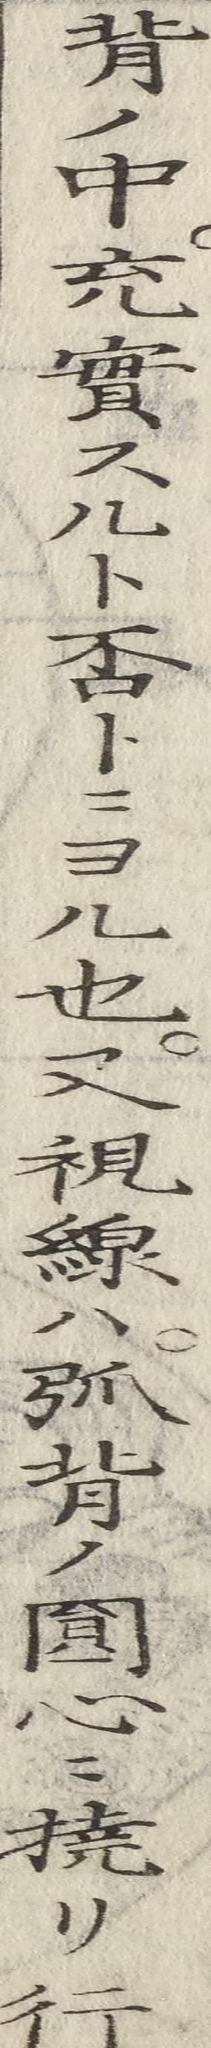背ノ中。充実スルト否トニヨル也。又視線ハ。弧背ノ円心ニ撓リ行
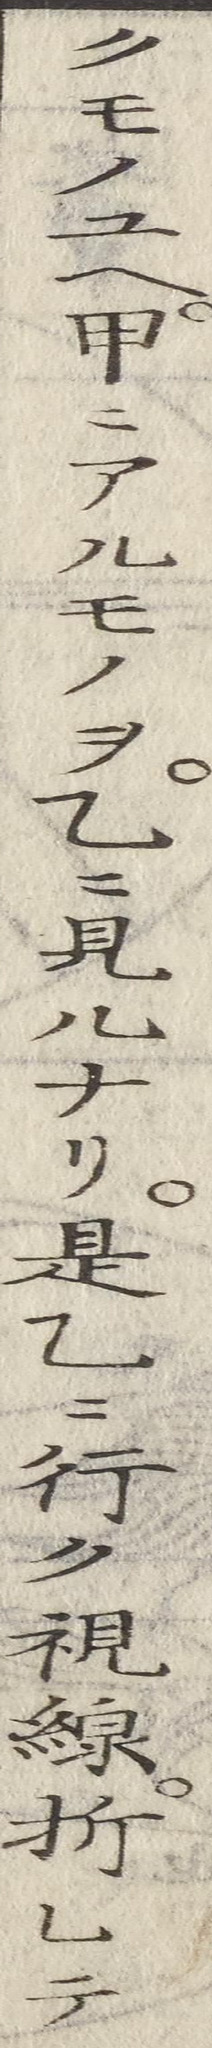クモノユヘ。甲ニアルモノヲ。乙ニ見ルナリ。是乙ニ行ク視線。折レテ
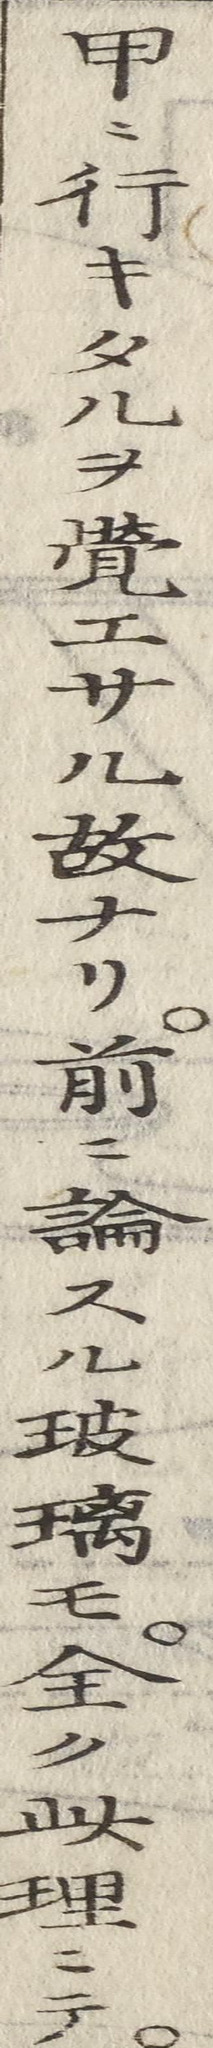甲ニ行キタルヲ覚エサル故ナリ。前ニ論スル玻璃モ。全ク此理ニテ。
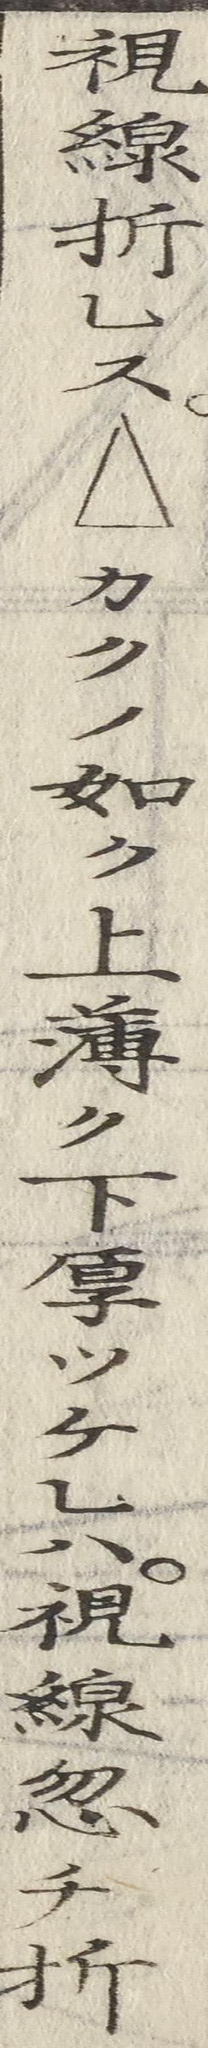視線折レス。カクノ如ク上薄ク下厚ツケレハ。視線忽チ折
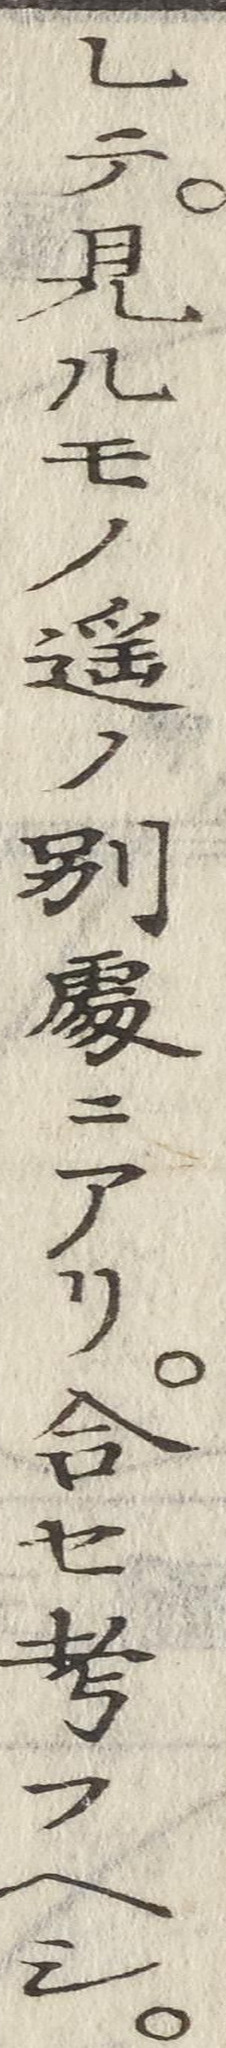レテ。見ルモノ遙ノ別処ニアリ。合セ考フヘシ。
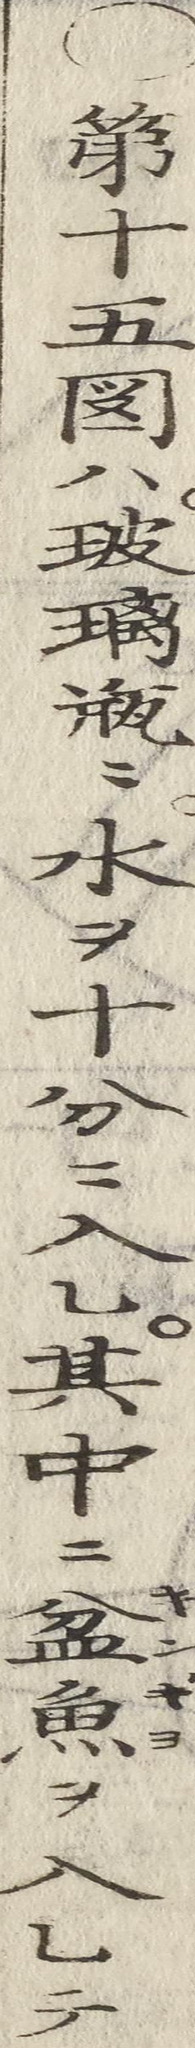○第十五図ハ。玻璃瓶ニ。水ヲ十分ニ入レ。其中ニ盆魚ヲ入レテ
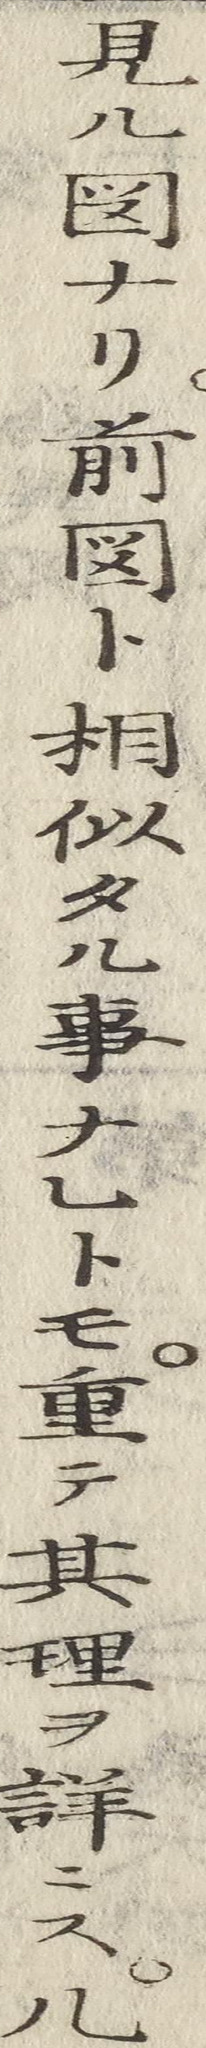見ル図ナリ。前図ト相似タル事ナレトモ。重テ其理ヲ詳ニス。凡
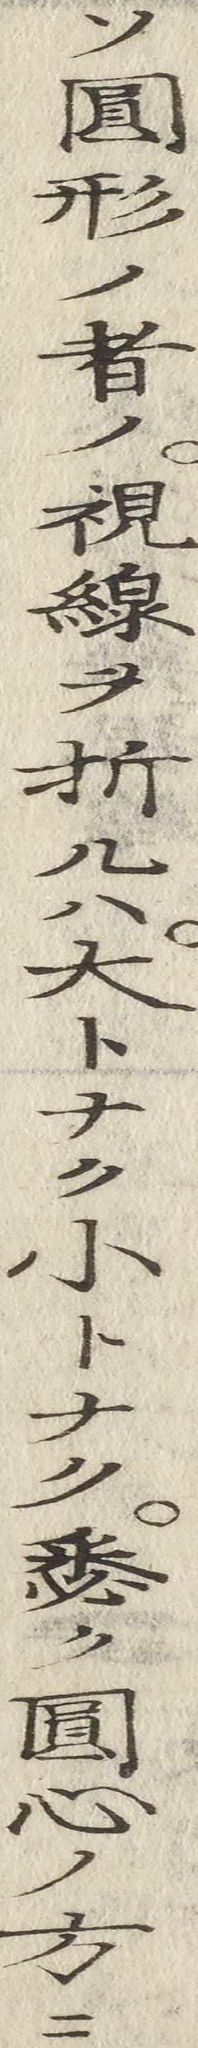ソ円形ノ者ノ。視線ヲ折ルハ。大トナク小トナク。悉ク円心ノ方ニ
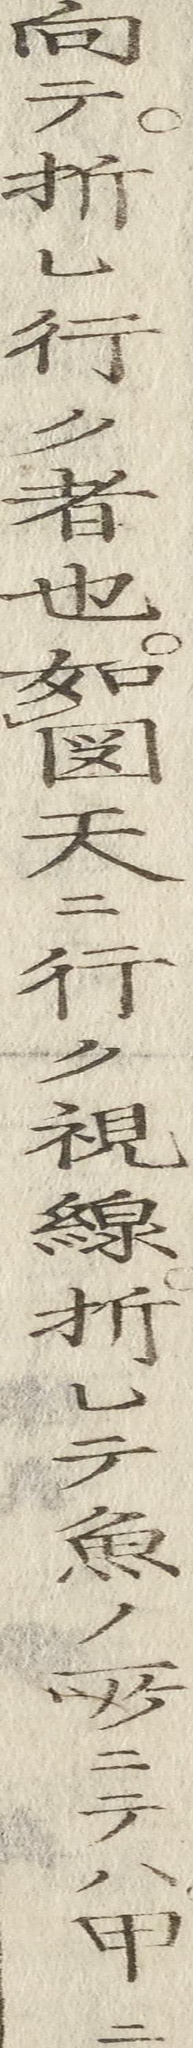向テ。折レ行ク者也。如図天ニ行ク視線折レテ魚ノ所ニテハ。甲ニ
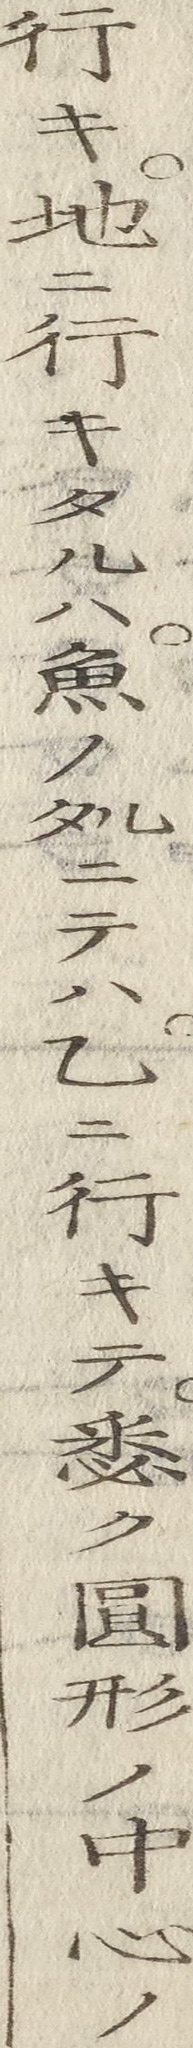行キ。地ニ行キタルハ。魚ノ処ニテハ。乙ニ行キテ。悉ク円形ノ中心ノ
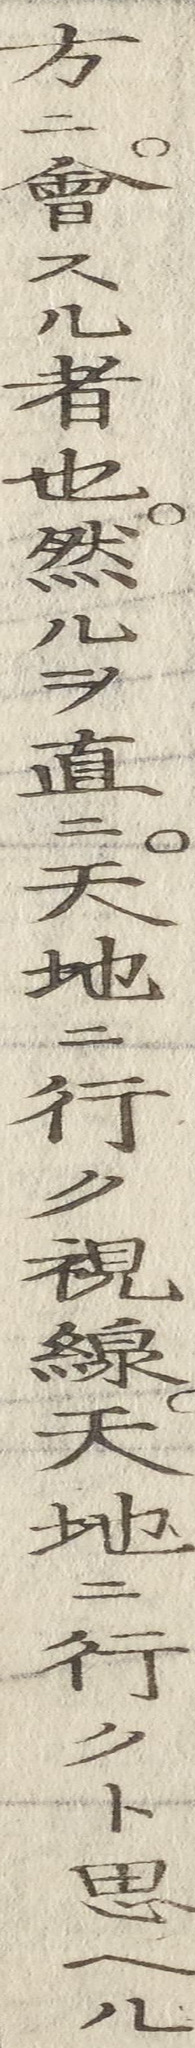方ニ。会スル者也。然ルヲ直ニ。天地ニ行ク視線。天地ニクト思ヘル
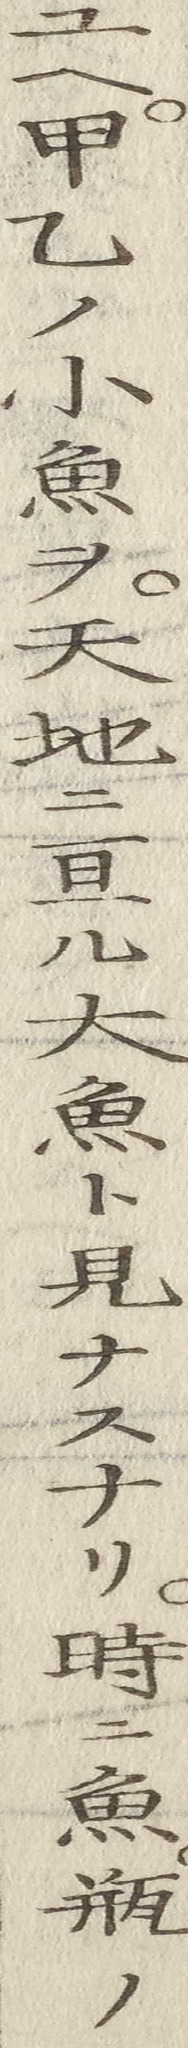ユヘ。甲乙ノ小魚ヲ。天地ニ亘ル大魚ト見ナスナリ。時ニ魚。瓶ノ
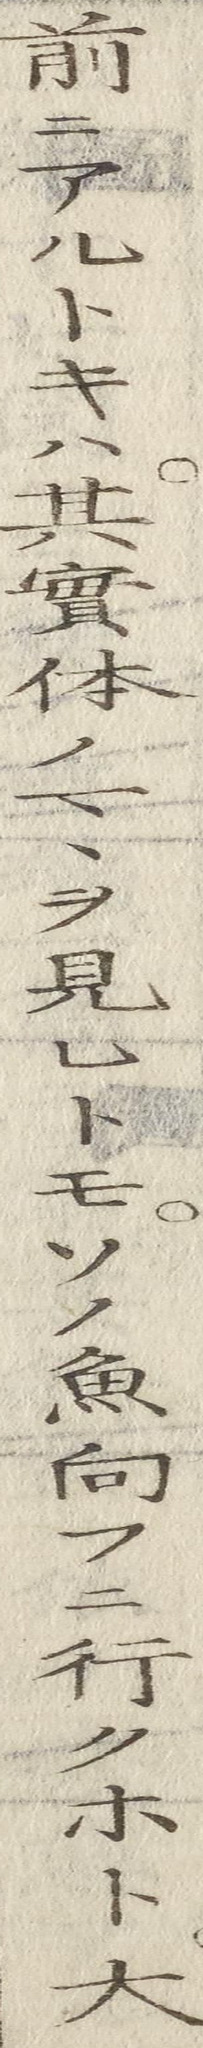前ニアルトキハ。其実体ノマヲ見レトモ。ソノ魚向フニ行クホト。大
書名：護法新論　上
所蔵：東京大学地震研究所図書室 Earthquake Research Institute Library, The University of Tokyo, JAPAN
